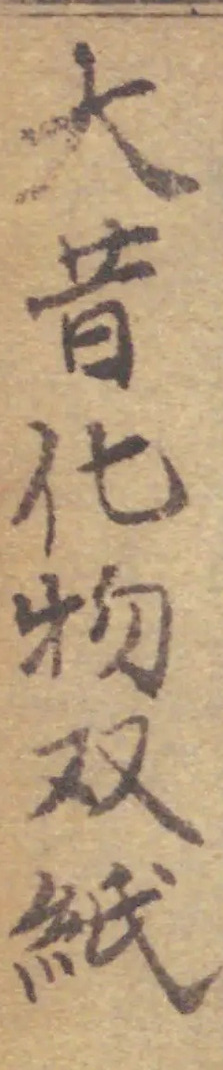大昔化物双紙完

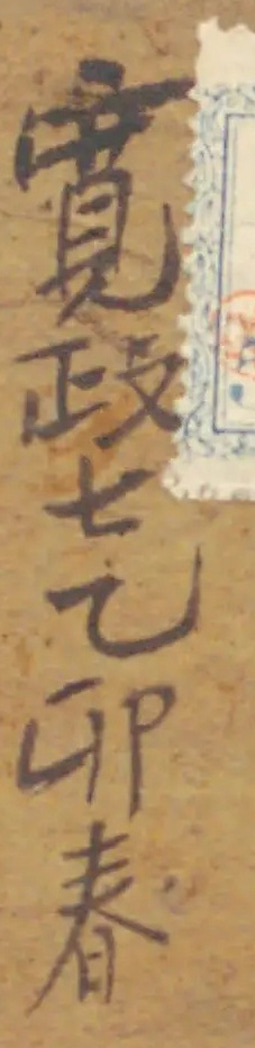寛政七乙卯春
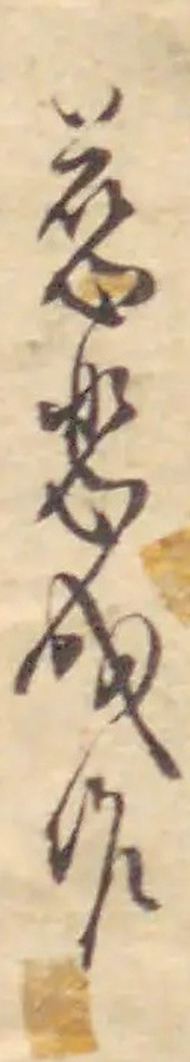慈悲成作
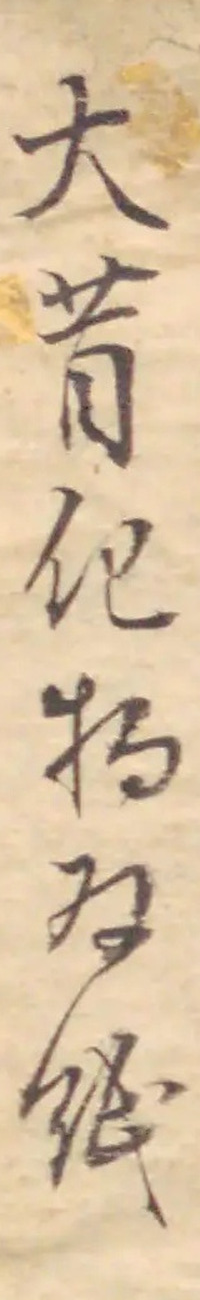大昔化物双紙
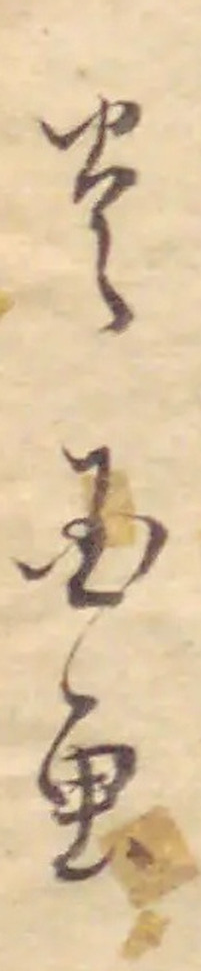豊国画

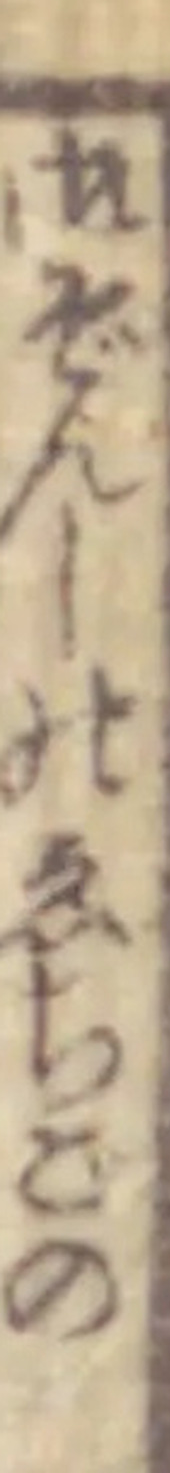御ぞんしのゑちごの
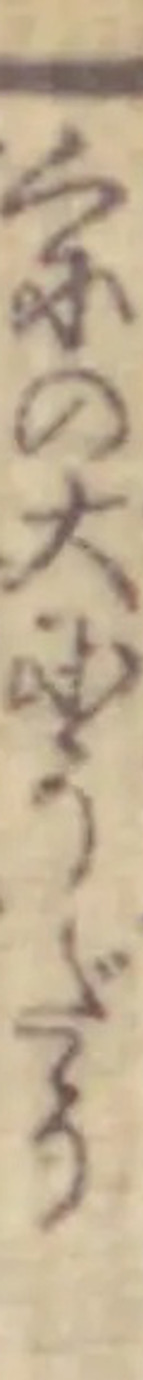くにの大にうだう
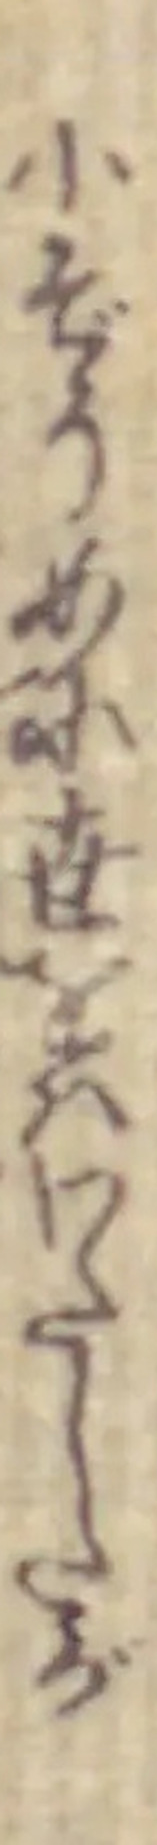小ぞうめに世をはわたしたが
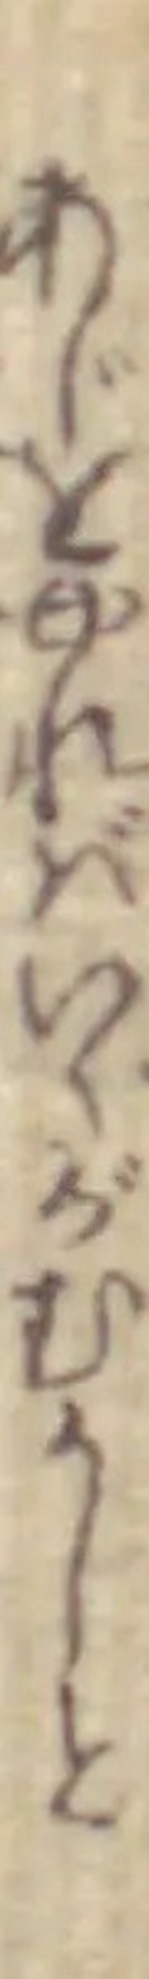あじをやればいゝがむかしと
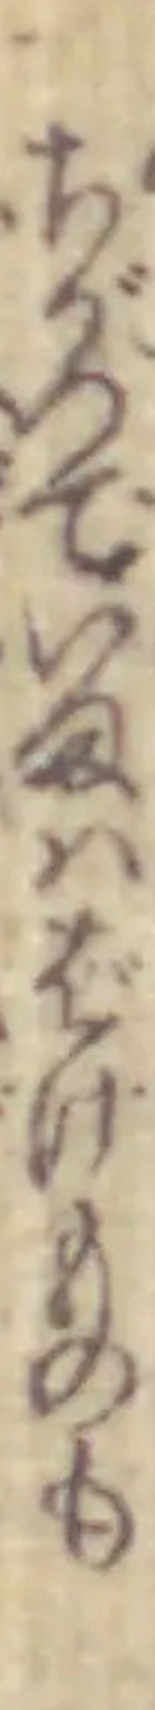ちがつていまはばけものも
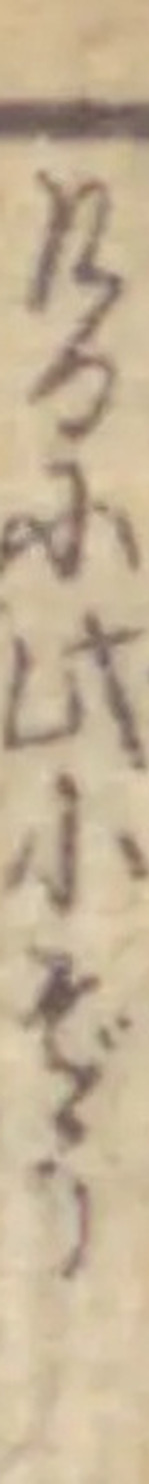けるに此小ぞう
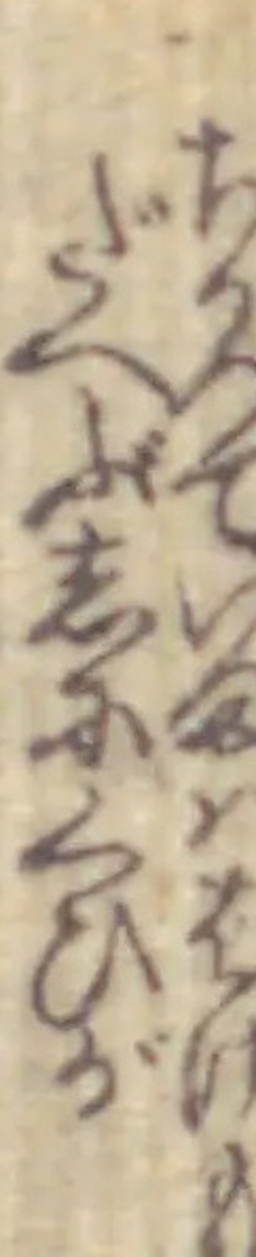だへぶしにくひが
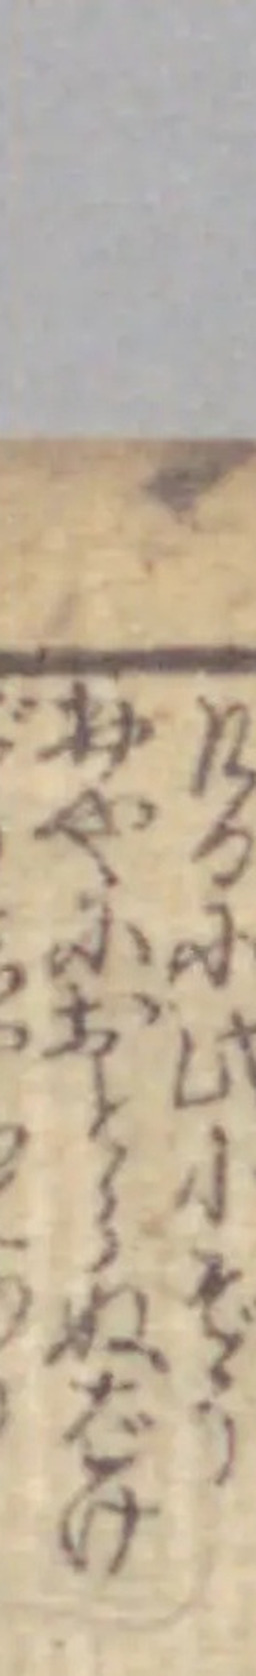おやにおとらぬばけ
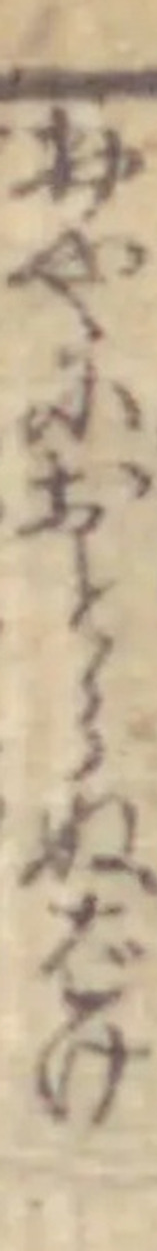おやにおとらぬばけ
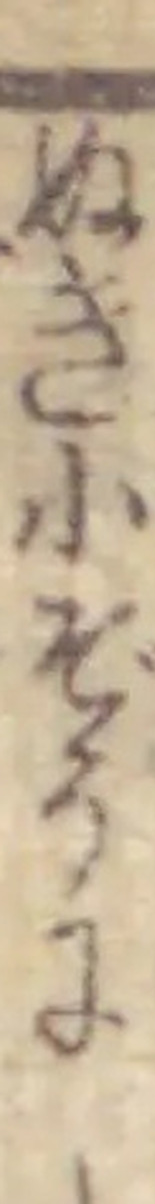ぬき小ぞうに
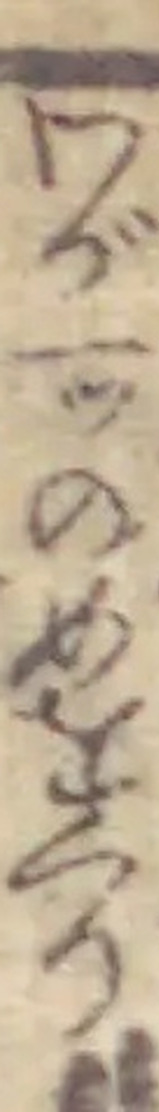わが一つめをくり
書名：大昔化物双紙 2巻
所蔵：国立国会図書館 National Diet Library, JAPAN
